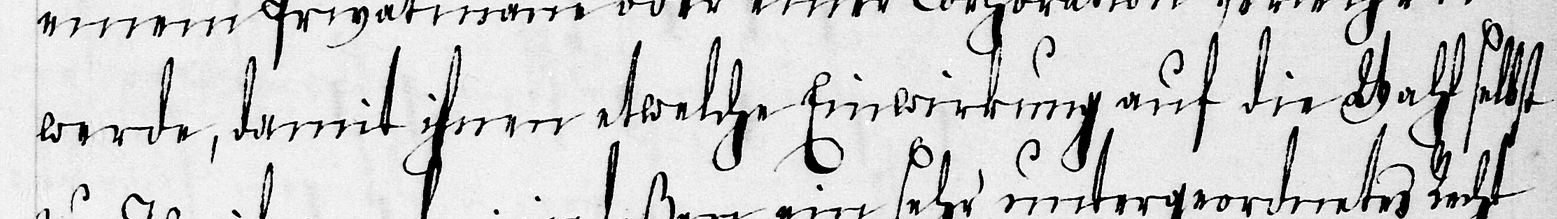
werde, damit ihnen etwelche Einwirkung auf die Wahl selbst
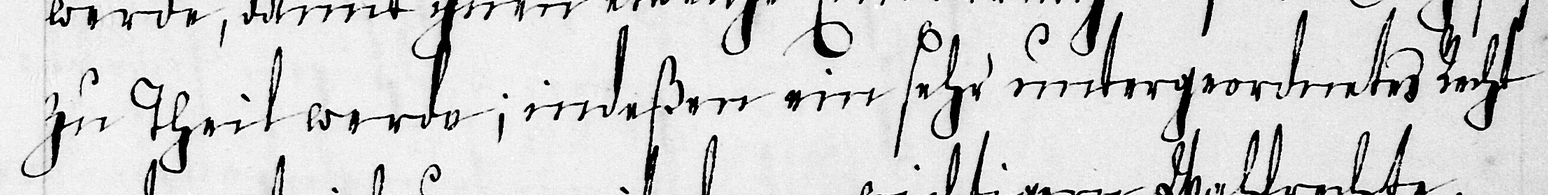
zu Theil werde; indeßen ein sehr untergeordnetes Recht
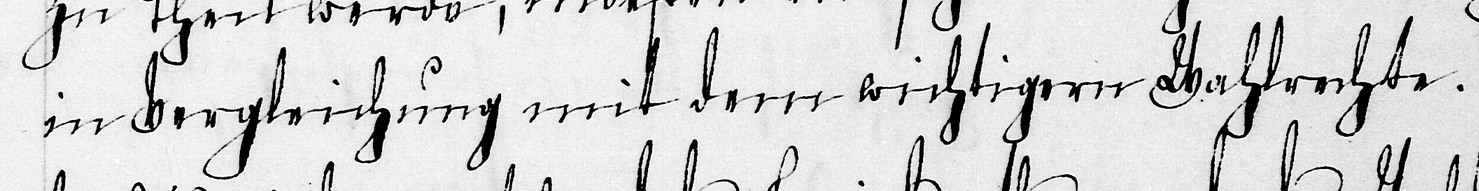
in Vergleichung mit dem wichtigern Wahlrechte
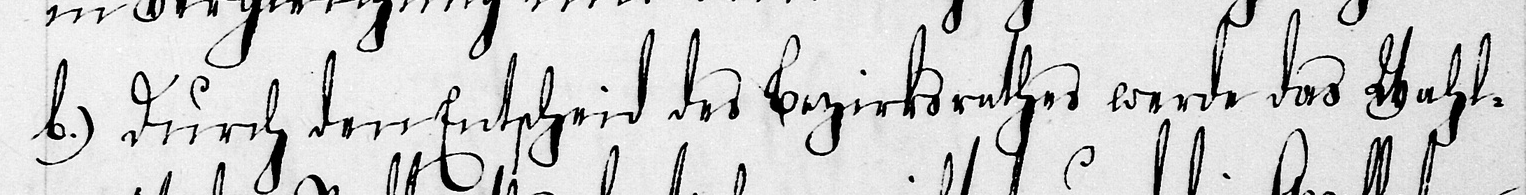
b.) Durch den Entscheid des Bezirksrathes werde das Wahl¬
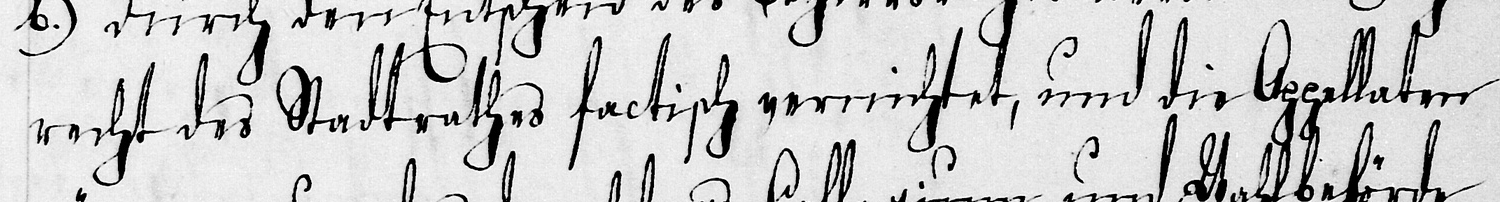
recht des Stadtrathes factisch vernichtet, und die Appellaten
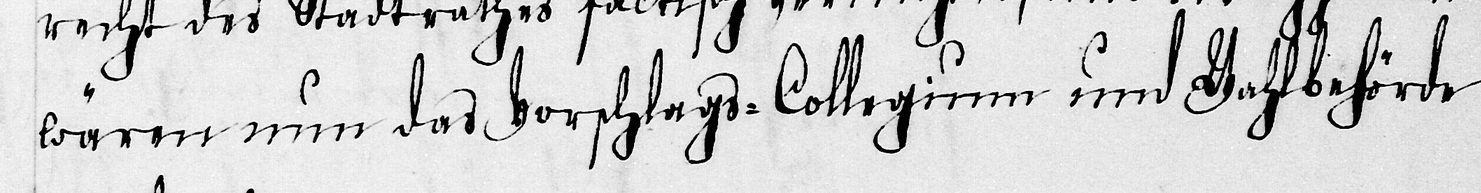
wären nun das Vorschlags-Collegium und Wahlbehörde
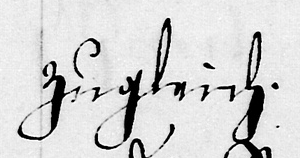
zugleich.
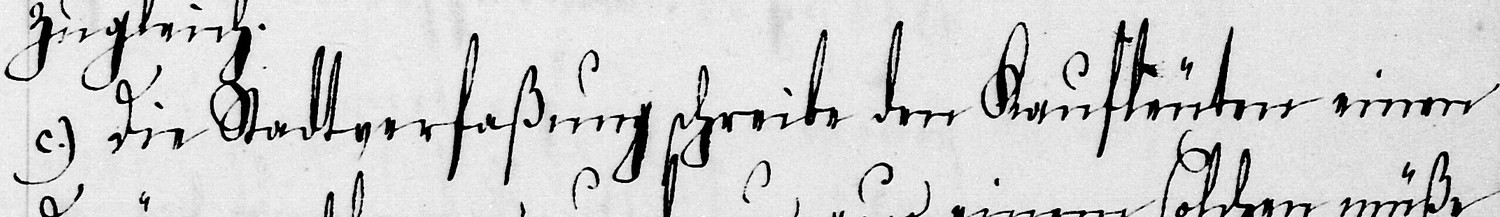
c.) Die Stadtverfaßung schreibe den Kaufleuten einen
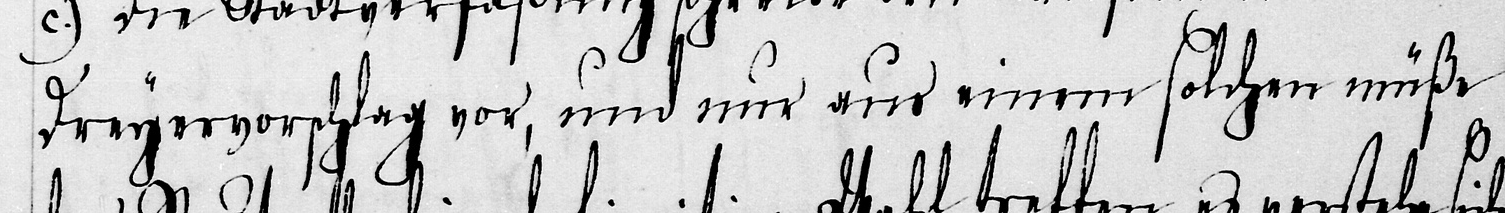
Dreyervorschlag vor, und nur aus einem solchen müße
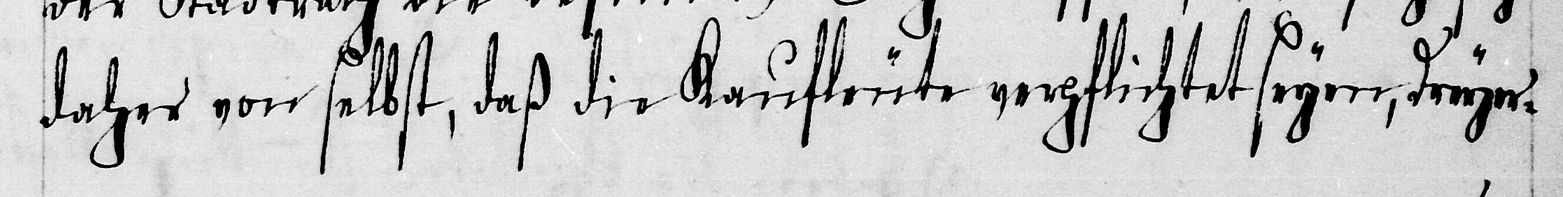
daher von selbst, daß die Kaufleute verpflichtet seyen, Dreyer-
